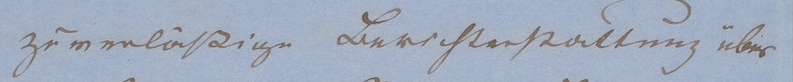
zuverläßige Berichterstattung über
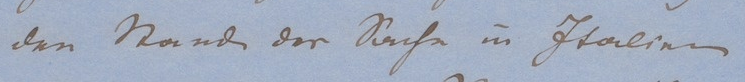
den Stand der Sache inItalien
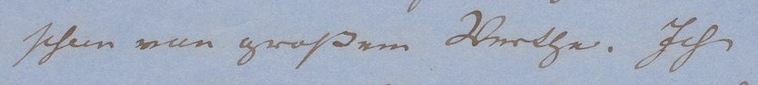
schon von großem Werthe. Ich
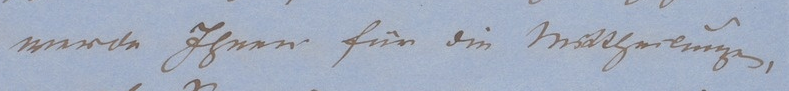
werde Ihnen für die Mittheilungen,
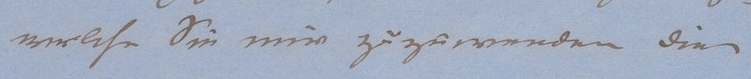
welche Sie mir zuzuwenden die
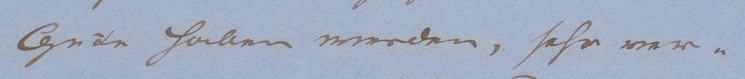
Güte haben werden, sehr ver-
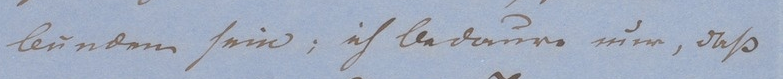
bunden sein; ich bedaure nur, daß
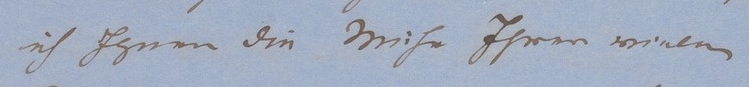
ich Ihnen die Mühe Ihrer vielen
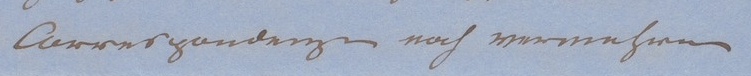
Correspondenzen noch vermehren
